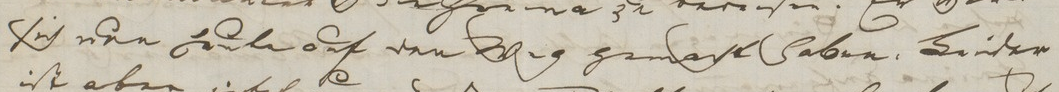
sich nun heute auf den Weg gemacht haben. Leider
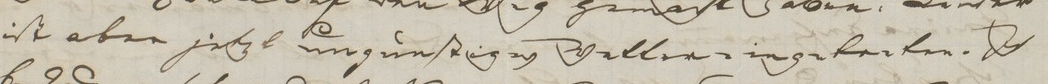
ist aber jetzt ungünstiges Wetter eingetreten. Ich
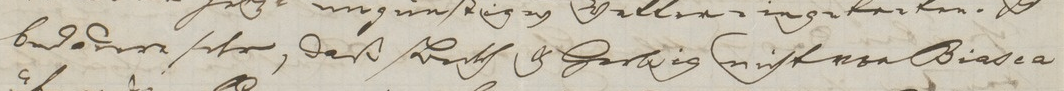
bedauere sehr, daß Beckh & Gerwig nicht von Biasca
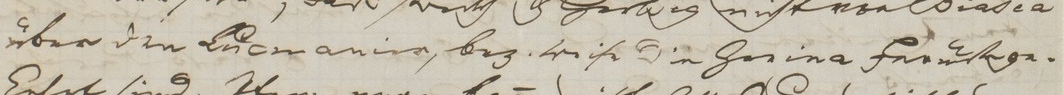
über den Lucmanier, bez.weise die Greina zurückge-
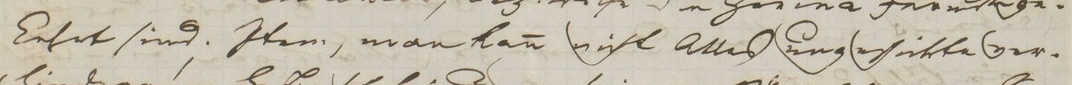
kehrt sind. Item, man kann nicht Alles ungeschickte ver-
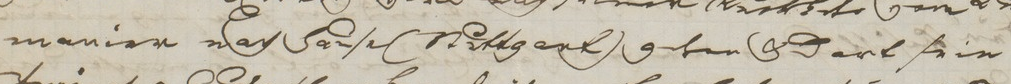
manier nach Hause (Stuttgart) gehen & dort sein
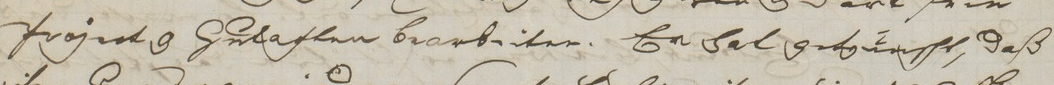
Project & Gutachten bearbeiten. Er hat gewünscht, daß
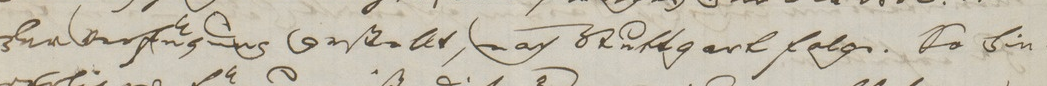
zur Verfügung gestellt, nach Stuttgart folge. So hin-
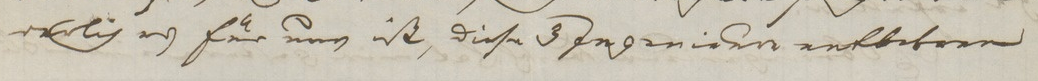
derlich es für uns ist, diese 3 Ingenieure entbehren
